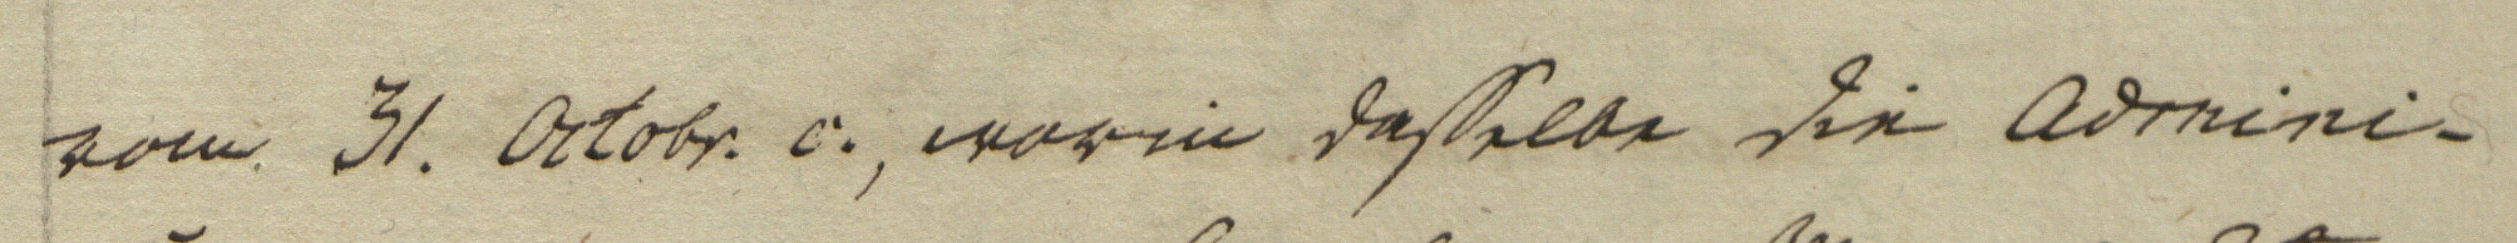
vom 31. Octobr. c., worin dasselbe die Admini¬
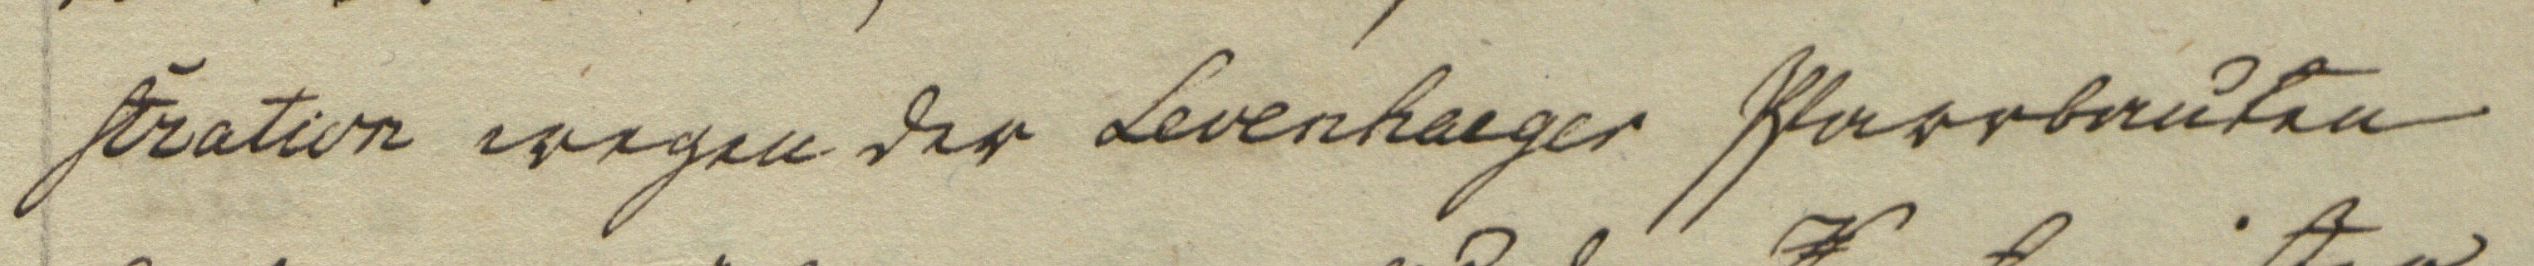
stration wegen der Levenhaeger Pfarrbauten
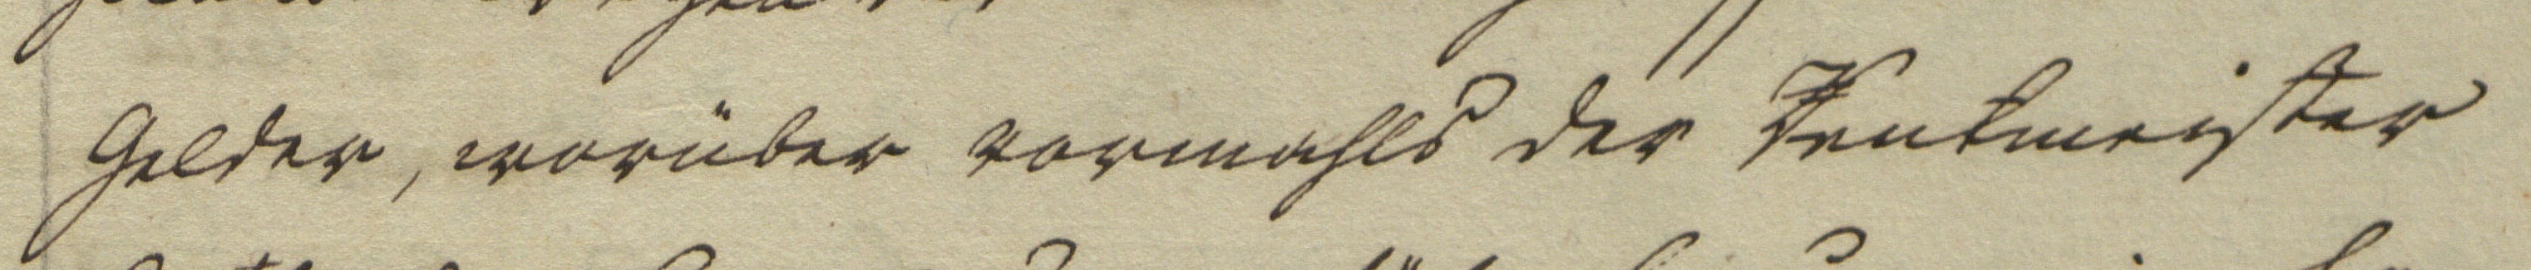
Gelder, worüber vormahls der Rentmeister
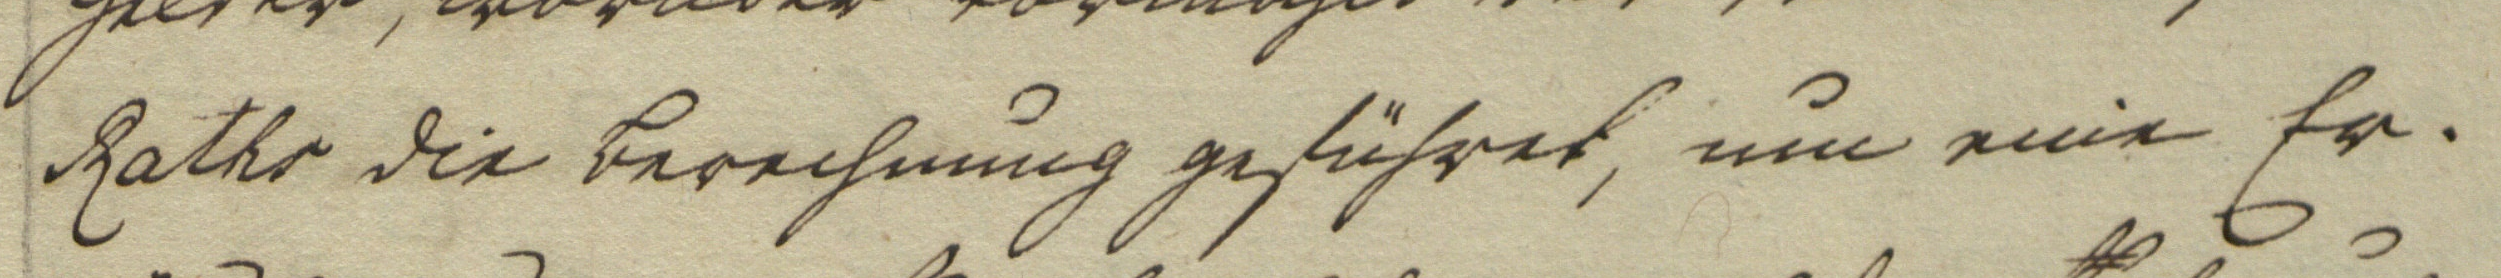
Raths die Berechnung geführet, um eine Er¬
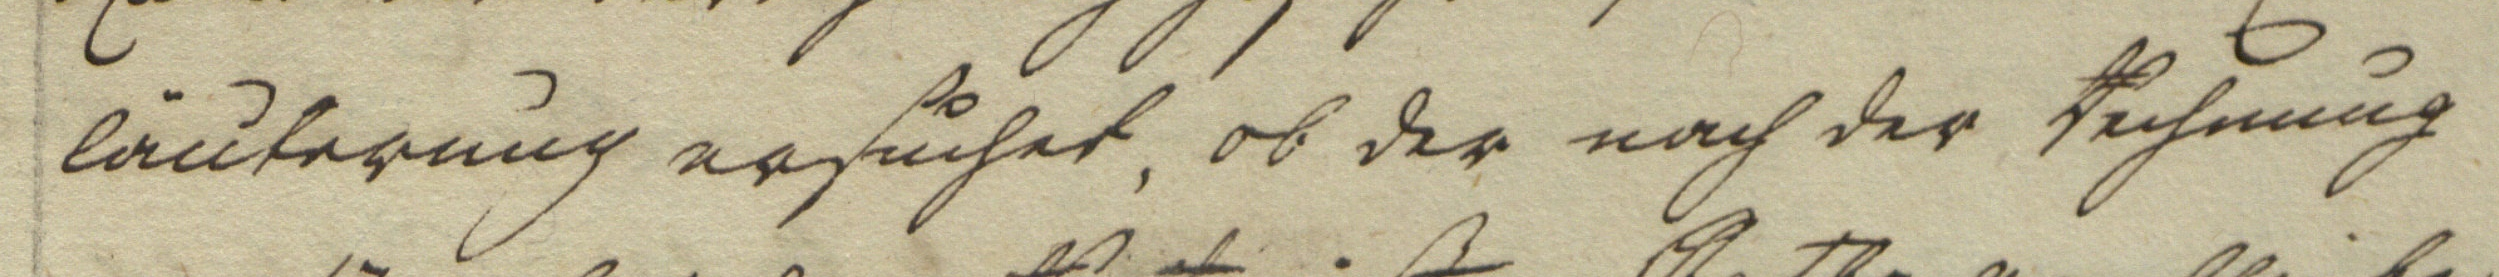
läuterung ersuchet, ob der nach der Rechnung
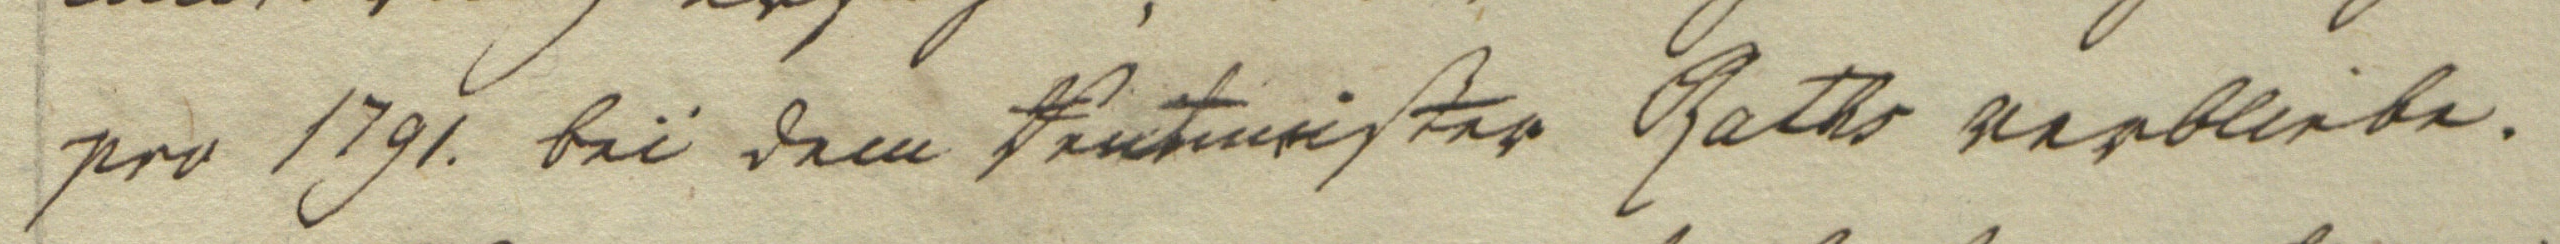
pro 1791. bei dem Rentmeister als verbliebe¬
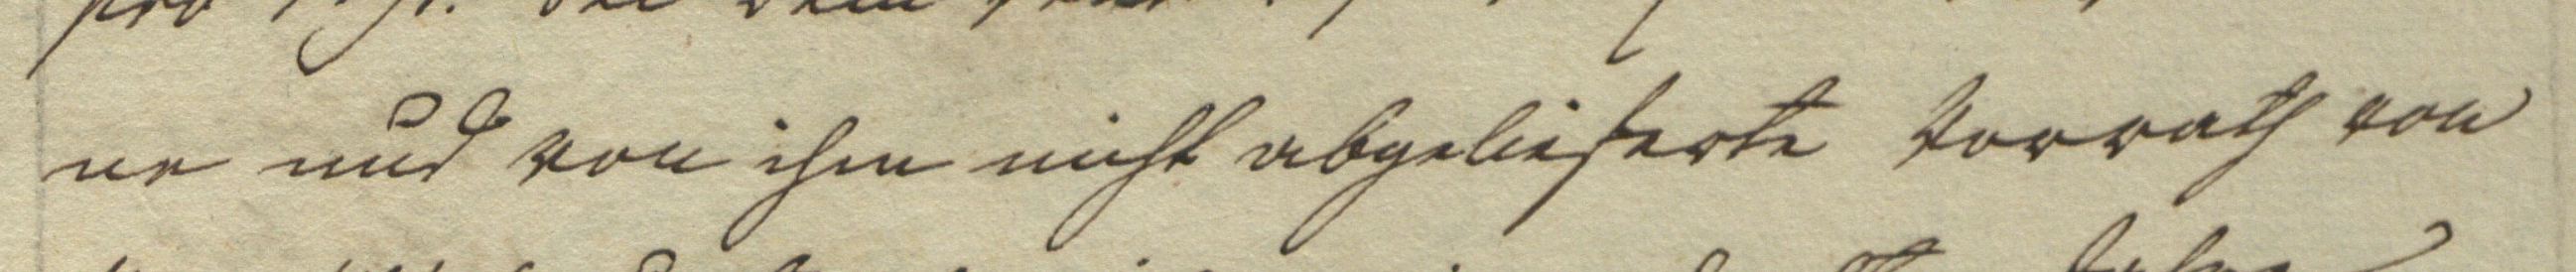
ne und von ihm nicht abgelieferte Vorrath von
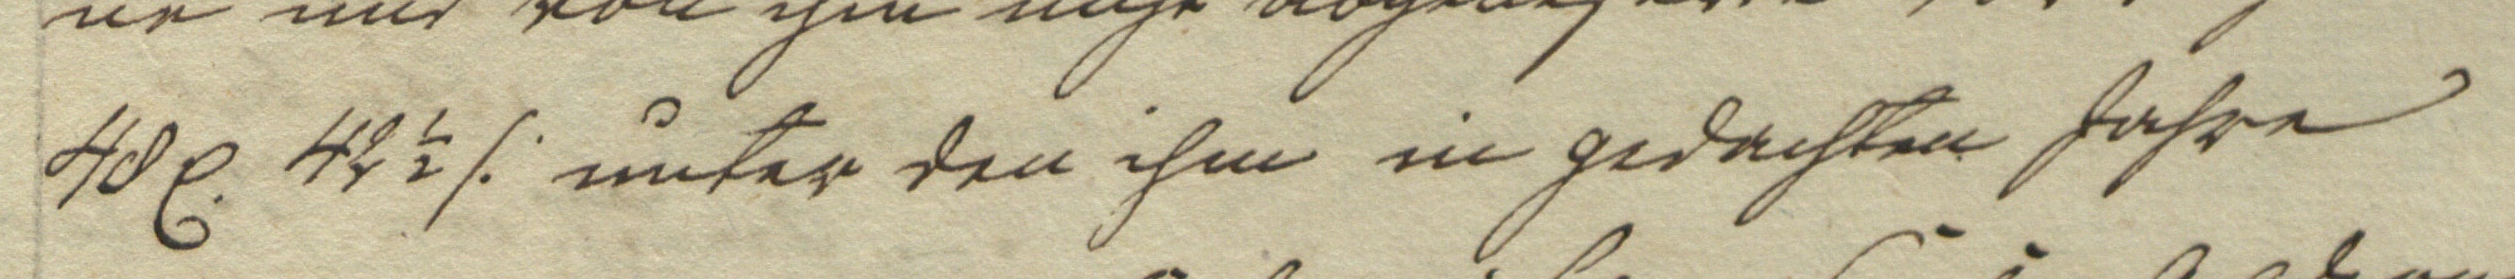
48 l. 42 ½ s. unter den ihm in gedachten Jahre
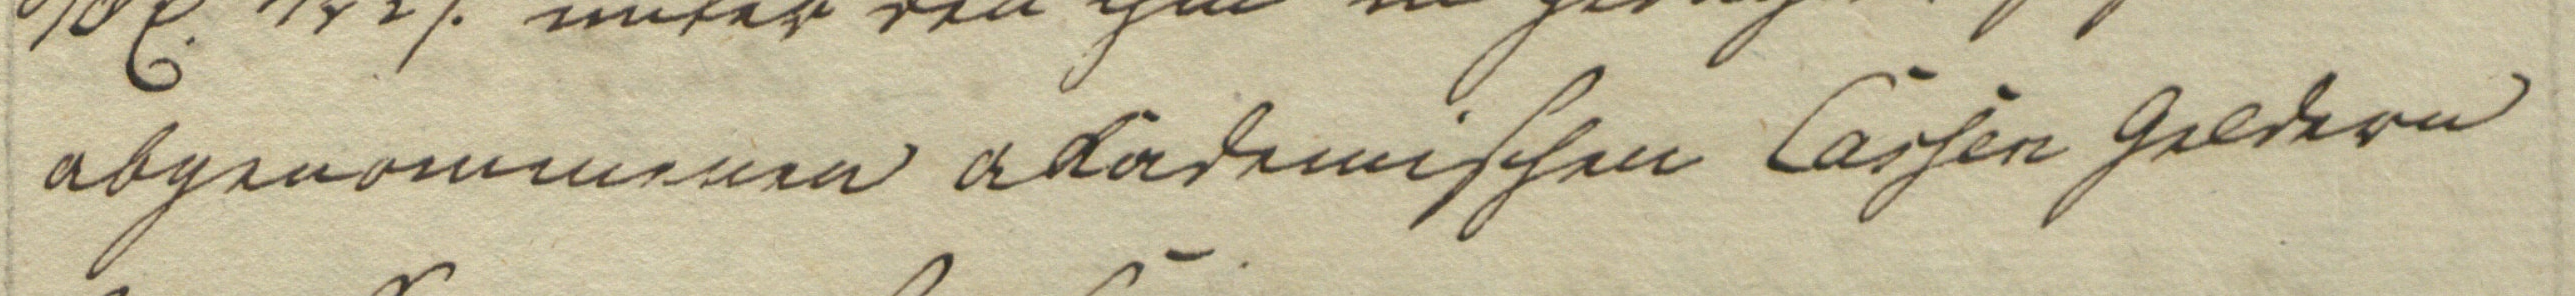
abgenommenen akademischen Cassen Geldern
